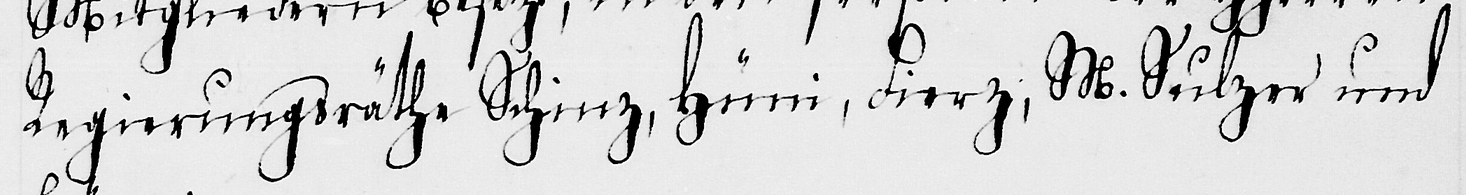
Regierungsräthe Schinz, Hüni, Fierz, M. Sulzer und
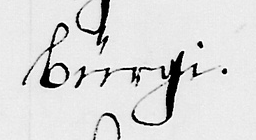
Bürgi.
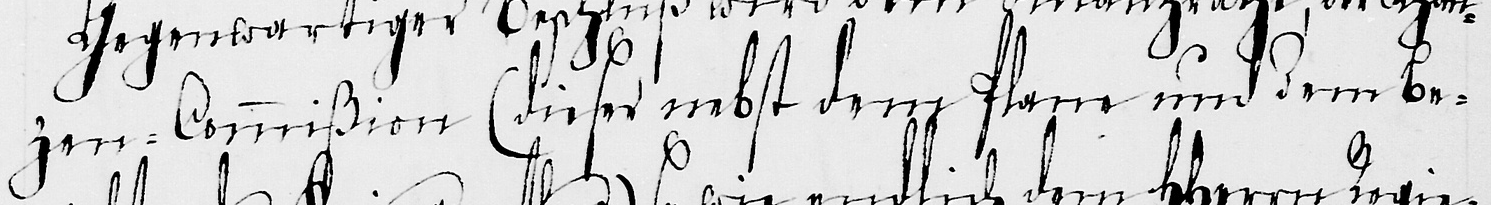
zen-Commißion (dieser nebst dem Plane und dem Be¬
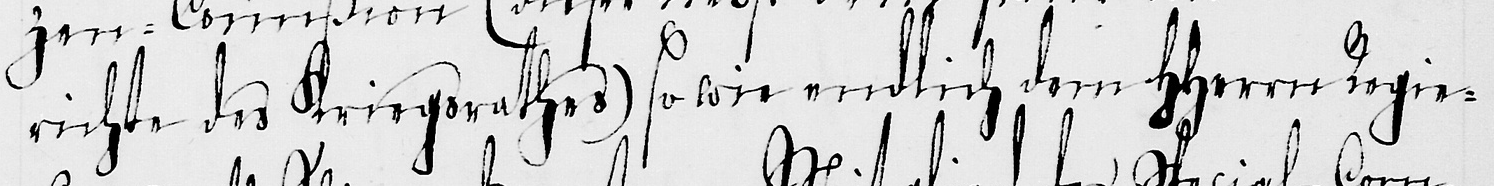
richte des Kriegsrathes) sowie endlich dem HHerrn Regie¬
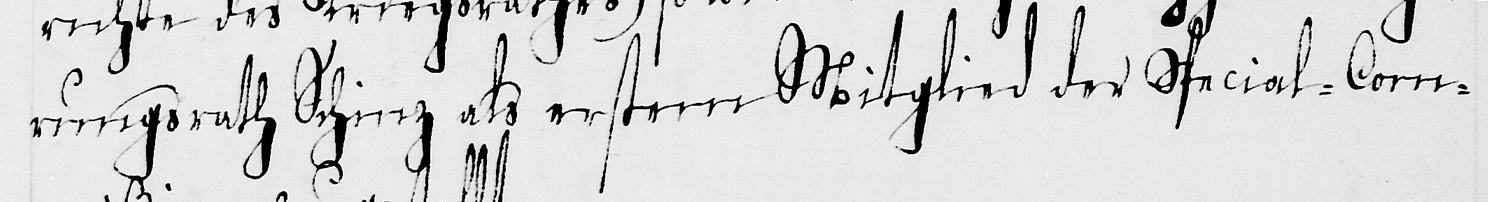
rungsrath Schinz als erstem Mitglied der Special-Com¬
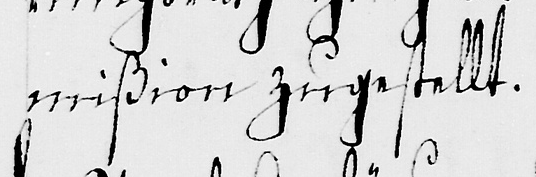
mißion zugestellt.
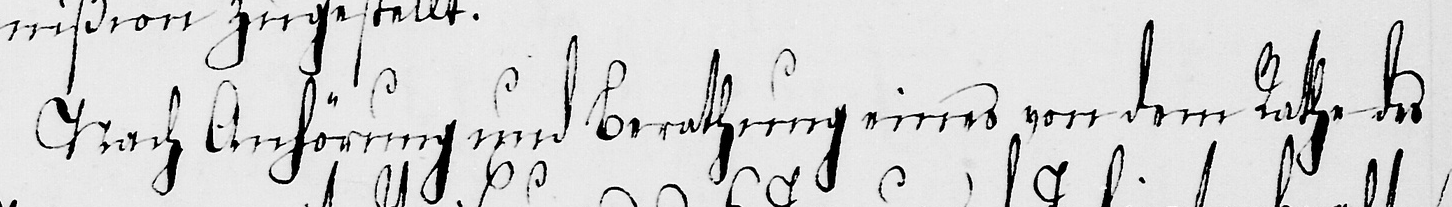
Nach Anhörung und Berathung eines von dem Rathe des
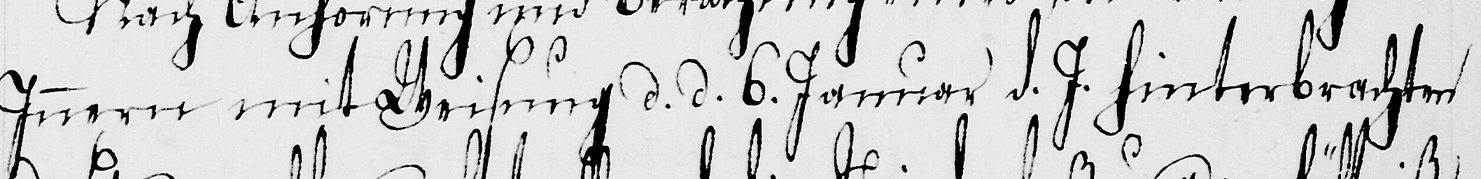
Innern mit Weisung d. d. 6. Januar d. J. hinterbrachten
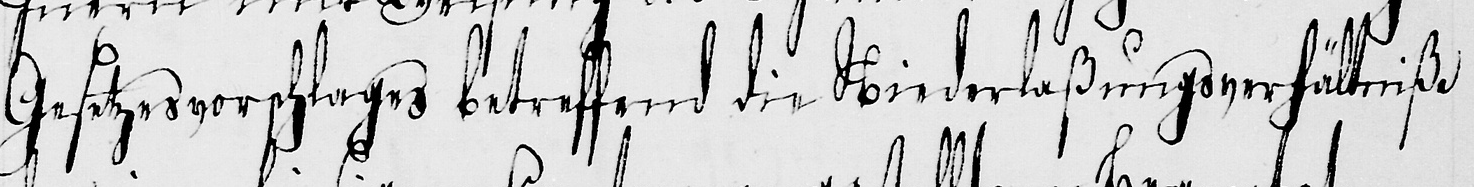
Gesetzesvorschlages betreffend die Niederlaßungsverhältniße
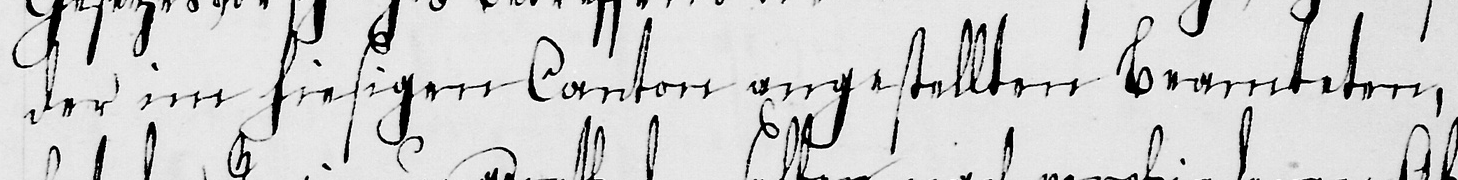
der im hiesigen Canton angestellten Beamteten,
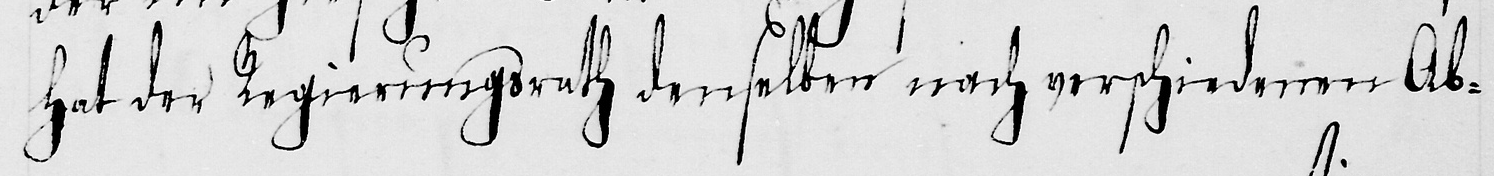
hat der Regierungsrath denselben nach verschiedenen Ab-
